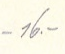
-16.-
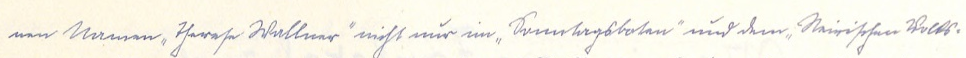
nen Namen "Therese Wallner" nicht nur im "Sonntagsboten" und dem "Steirischen Volks-
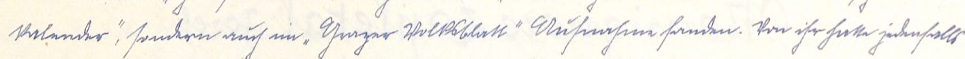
kalender", sondern auch im "Grazer Volksblatt" Aufnahme fanden. Von ihr hatte jdenfalls
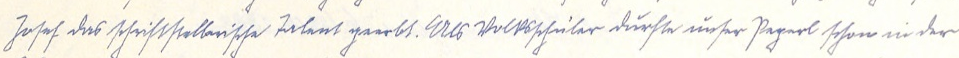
Josef das schrifstellerische Talend geerbt. Als Volksschüer durfte unser Peperl schon in der
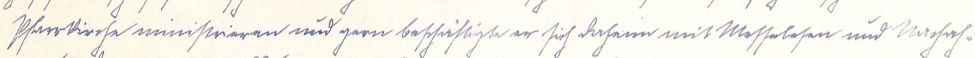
Pfarrkirche ministrieren und gern beschäftigte er sich daheim mit Messelesen und Nachah-
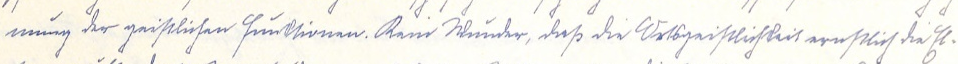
munt der geistlichen Funktionen. Kein Wunder, daß die Ortsgeistlichkeit ernstlich die El-
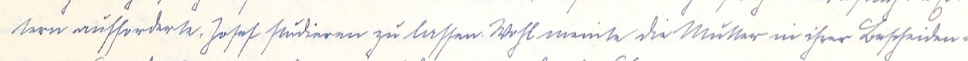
tern aufforderte, Josef studieren zu lassen. Wohl meinte die Mutter in ihrer Bescheiden-
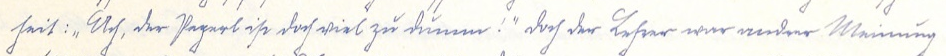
heit: "Ach, der Peper ist doch viel zu dumm!" doch der Lehrer war andrer Meinung
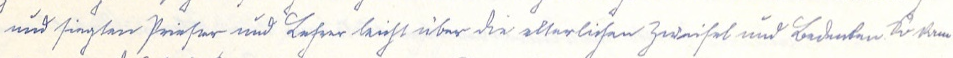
und siegten Priester und Lehrer leicht über die elterlichen Zweifel und Bedenken. So kam
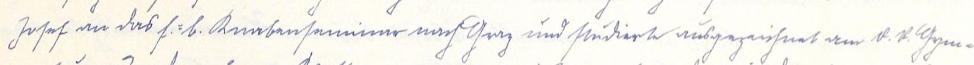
Josef an das f.-b. Knabenseminar nach Graz und studierte ausgezeichnet am k. k. Gym-
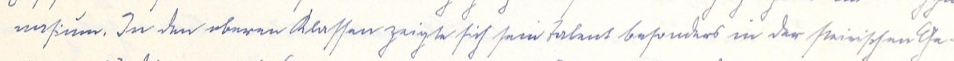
nasium. In den oberen Klassen zeigte sich Talent besonders in der steirischen Ge-
